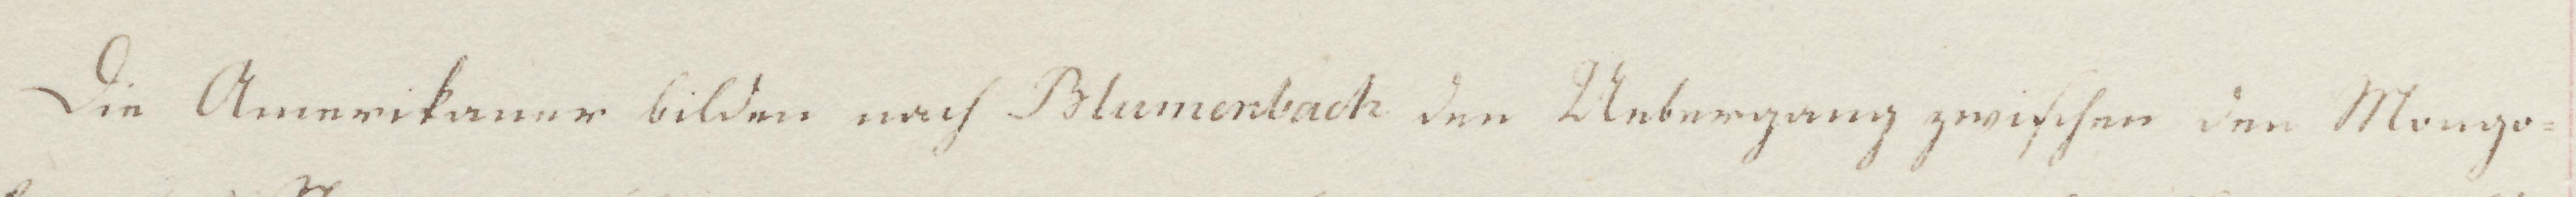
Die Amerikaner bilden nach Blumenbach den Uebergang zwischen den Mongo-
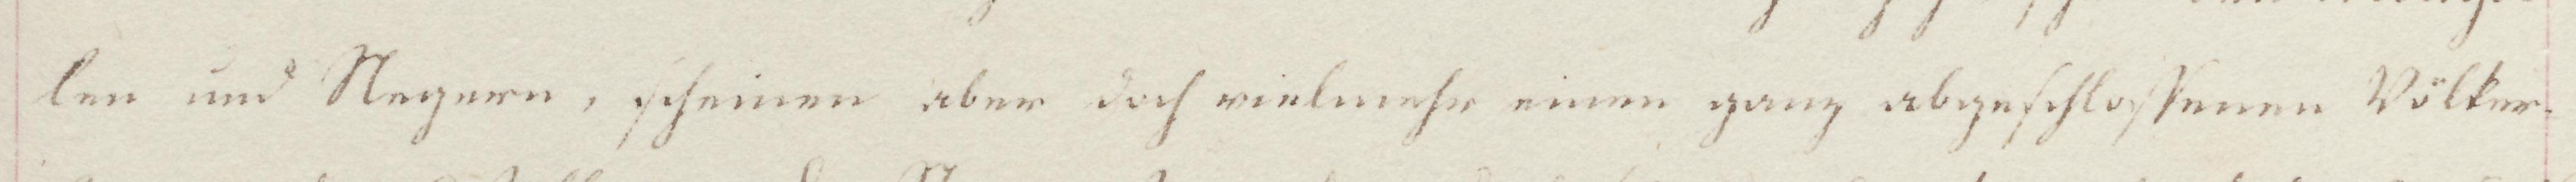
len und Negern, scheinen aber doch vielmehr einen ganz abgeschlossenen Völker-
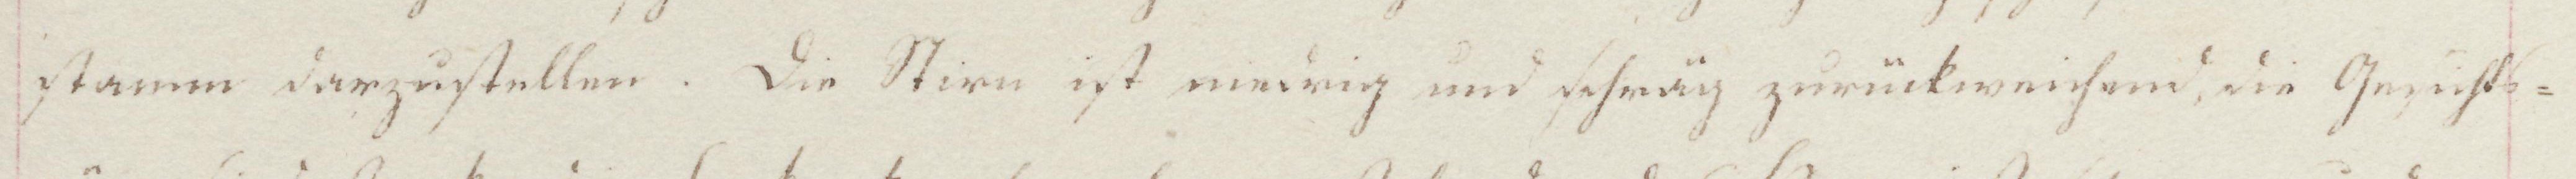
stamm darzustellen. Die Stirn ist niedrig und schräg zurückweichend, die Gesichts-
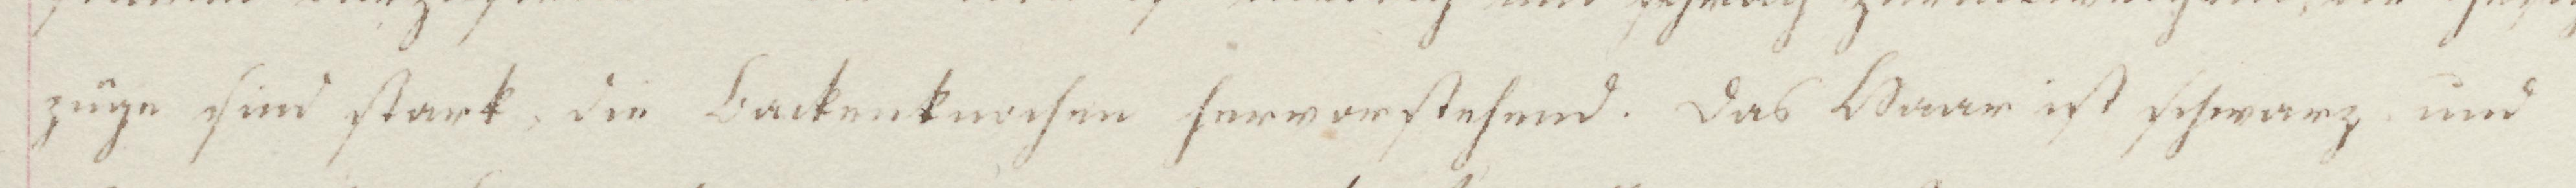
züge sind stark, die Backenknochen hervorstehend. Das Haar ist schwarz und
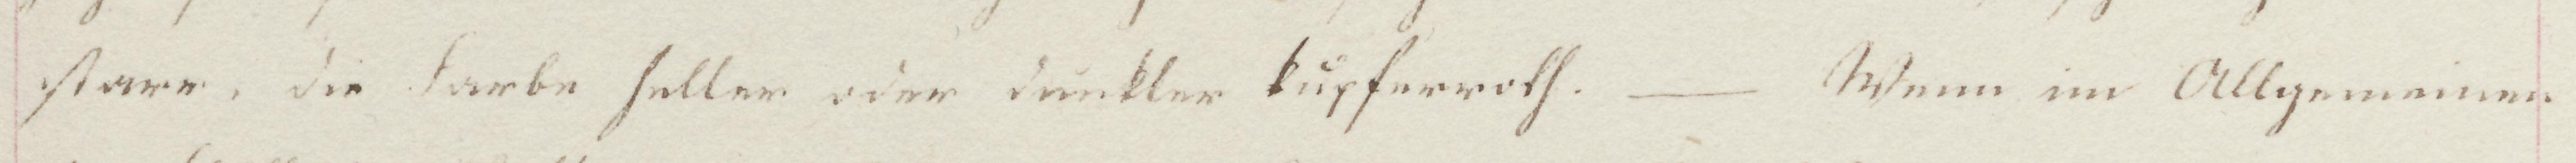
starr, die Farbe heller oder dunkler kupferroth. – Wenn im Allgemeinen
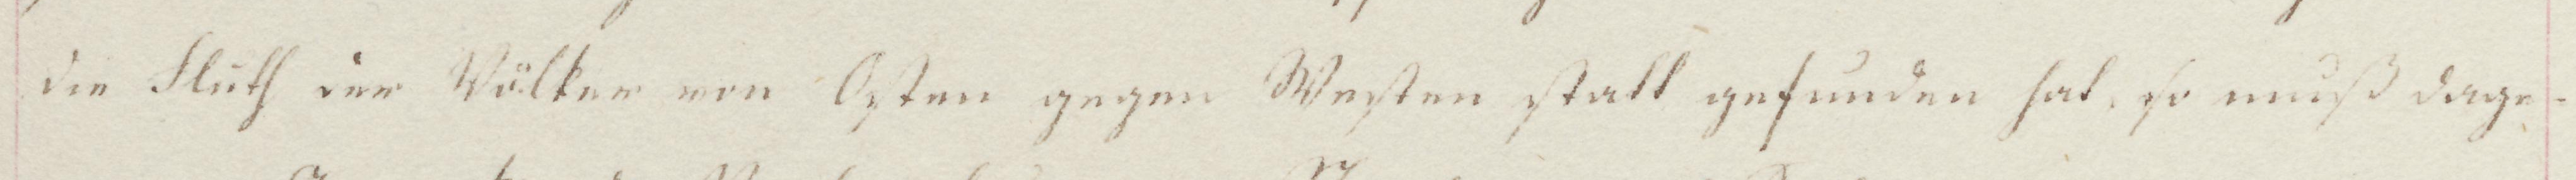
die Fluth der Völker von Osten gegen Westen statt gefunden hat, so muß dage-
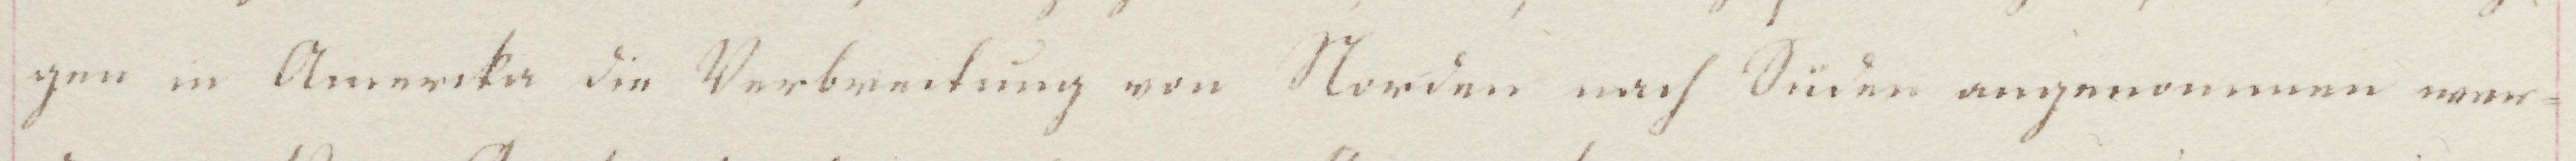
gen in Amerika die Verbreitung von Norden nach Süden angenommen wer-
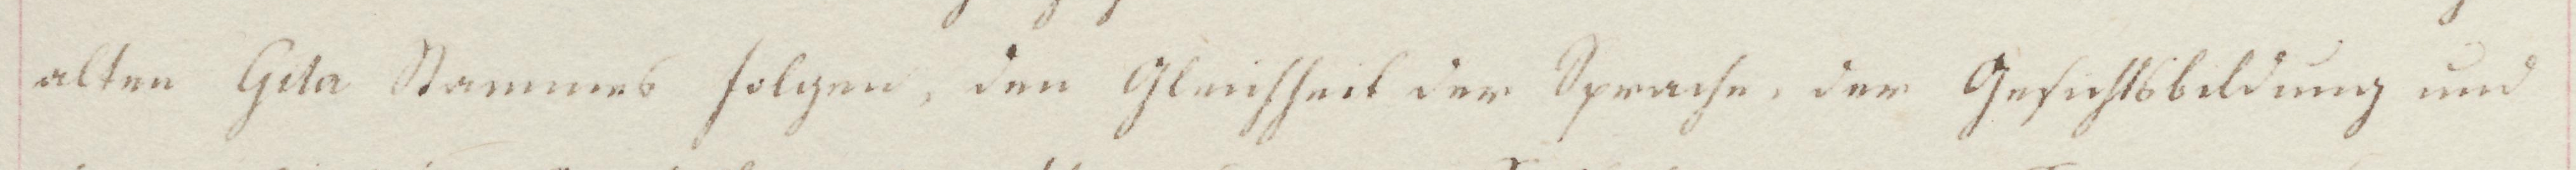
alten Gila Stammes folgen, den Gleichheit der Sprache, der Gesichtsbildung und
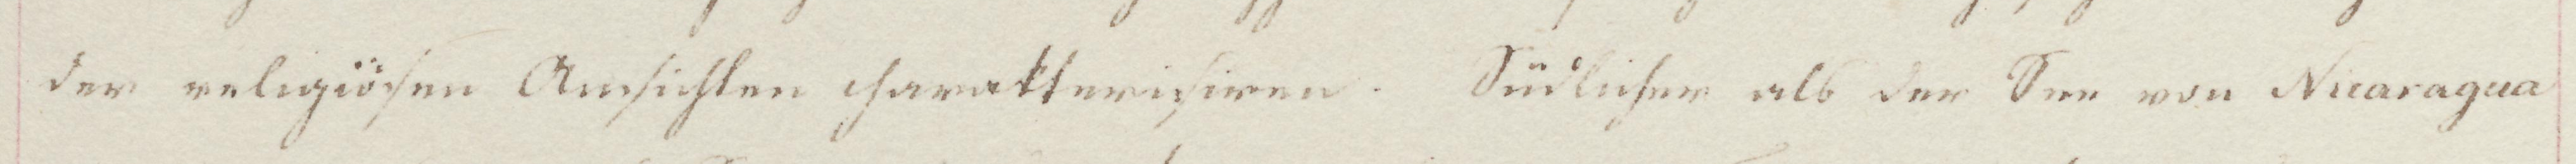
der religiösen Ansichten charakterisiren. Südlicher als der See von Nicaragua
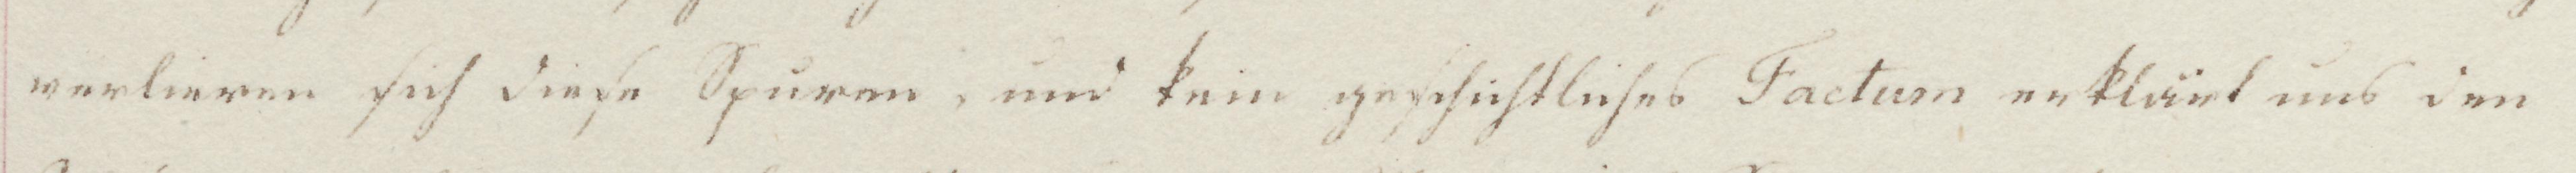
verlieren sich diese Spuren, und kein geschichtliches Factum erklärt uns den
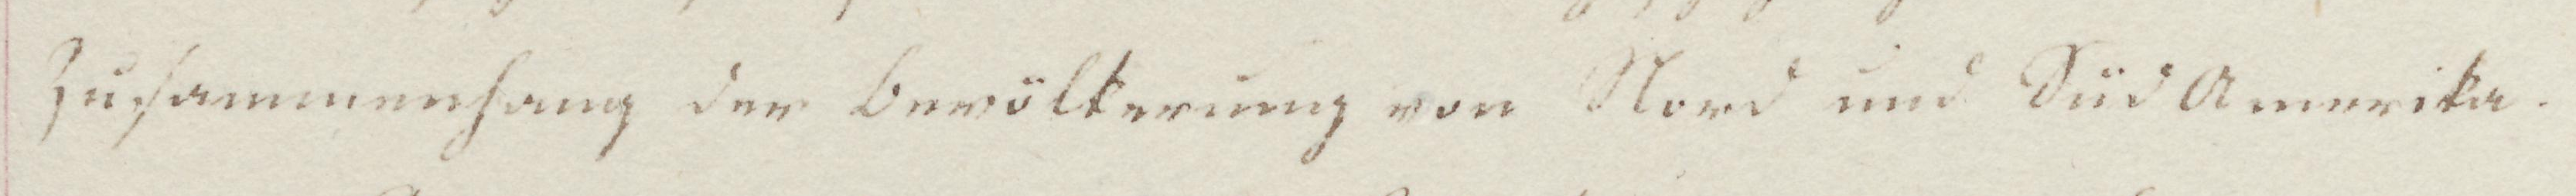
Zusammenhang der Bevölkerung von Nord und SüdAmerika.
